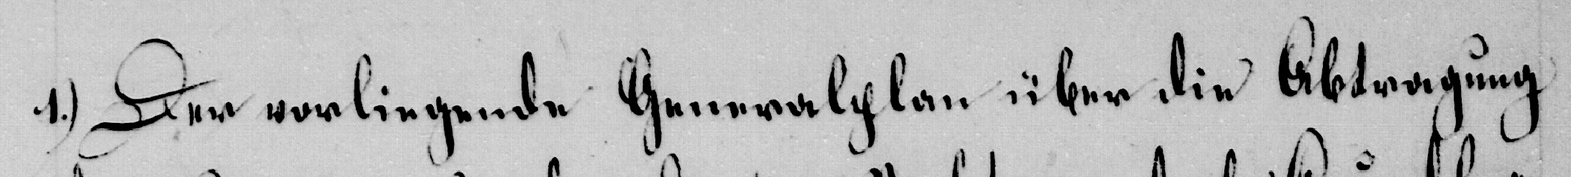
1.) Der vorliegende Generalplan über die Abtragung
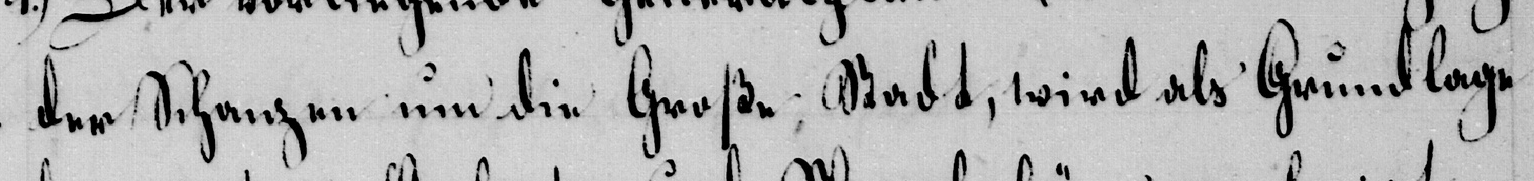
der Schanzen um die Große Stadt, wird als Grundlage
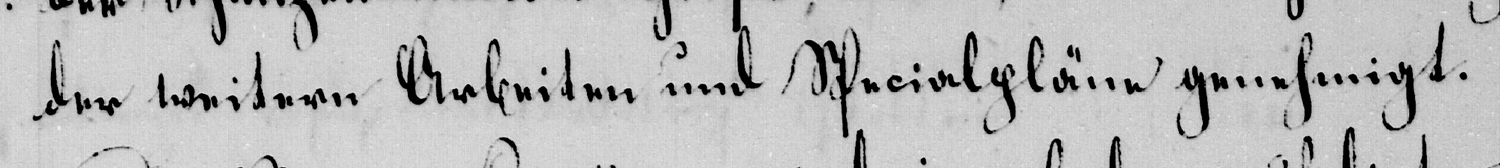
der weitern Arbeiten und Specialpläne genehmigt.
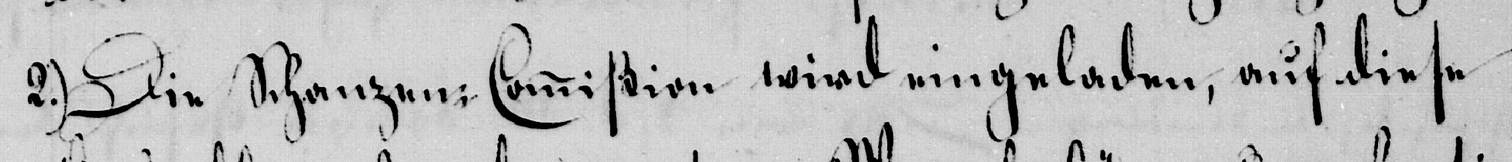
2.) Die Schanzen-Commißion wird eingeladen, auf diese
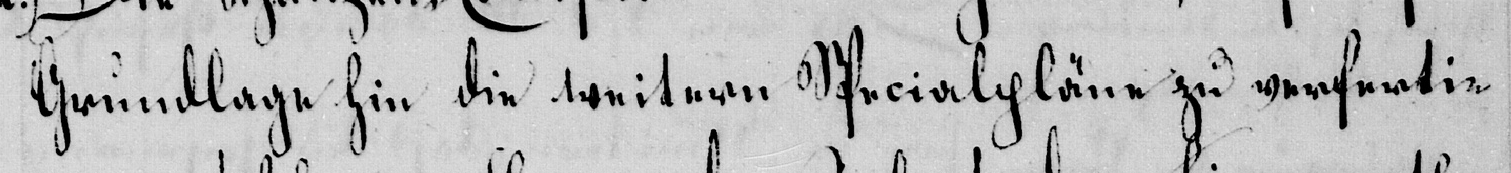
Grundlage hin die weitern Specialpläne zu verferti¬
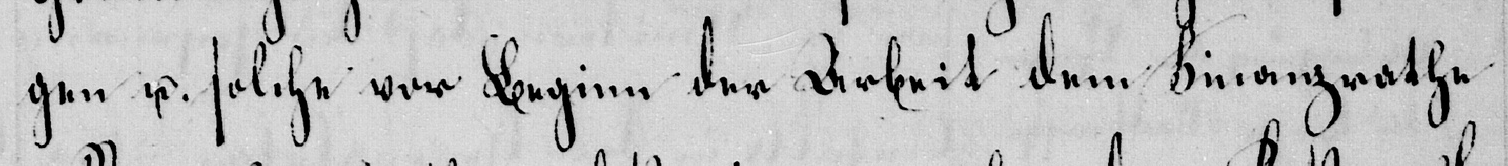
gen u. solche vor Beginn der Arbeit dem Finanzrathe
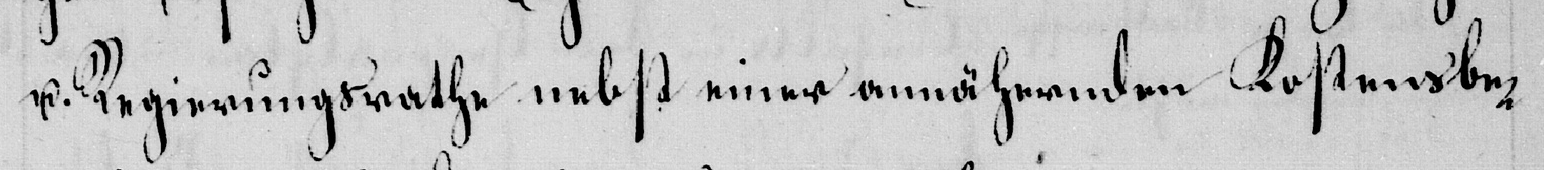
u. Regierungsrathe nebst einer annähernden Kostensbe¬
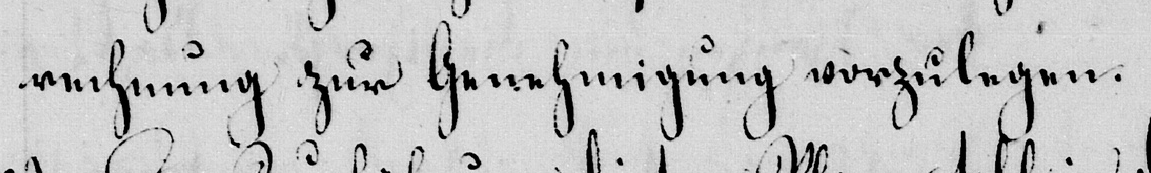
rechnung zur Genehmigung vorzulegen.
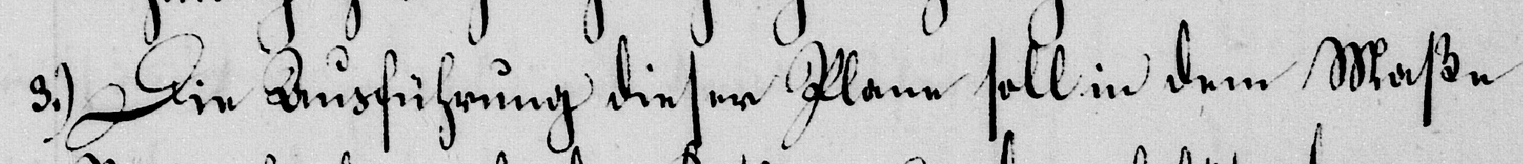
3.) Die Ausführung dieser Plane soll in dem Maße
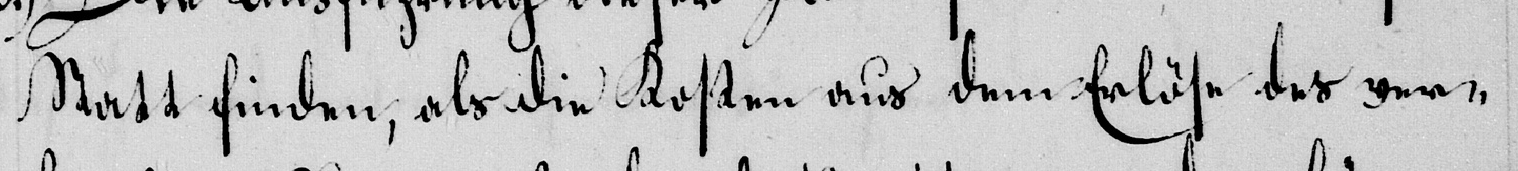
Statt finden, als die Kosten aus dem Erlöse des ver¬
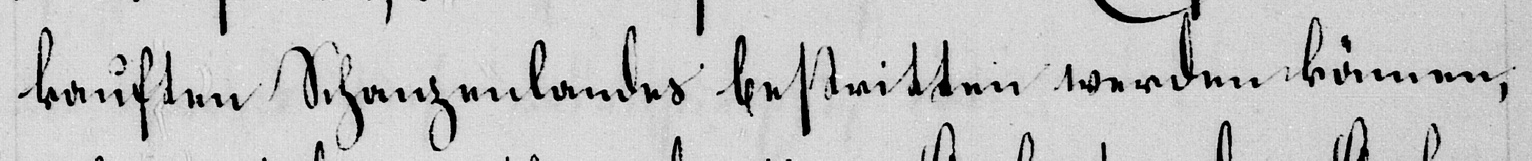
kauften Schanzenlandes bestritten werden können,
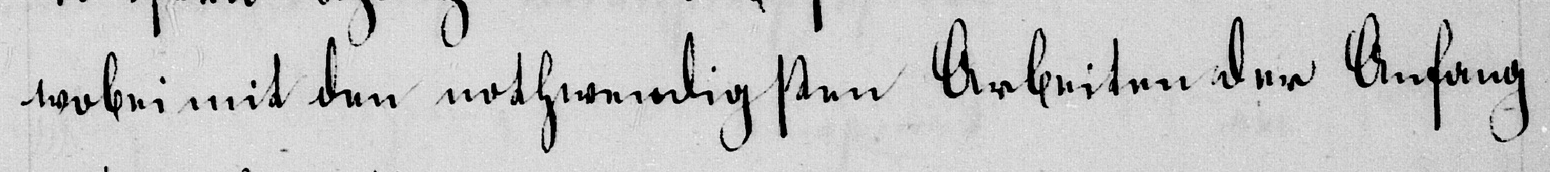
wobei mit den nothwendigsten Arbeiten der Anfang
